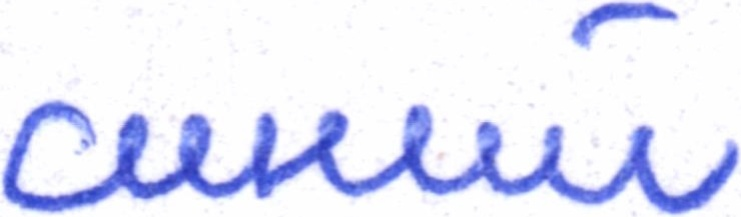синий
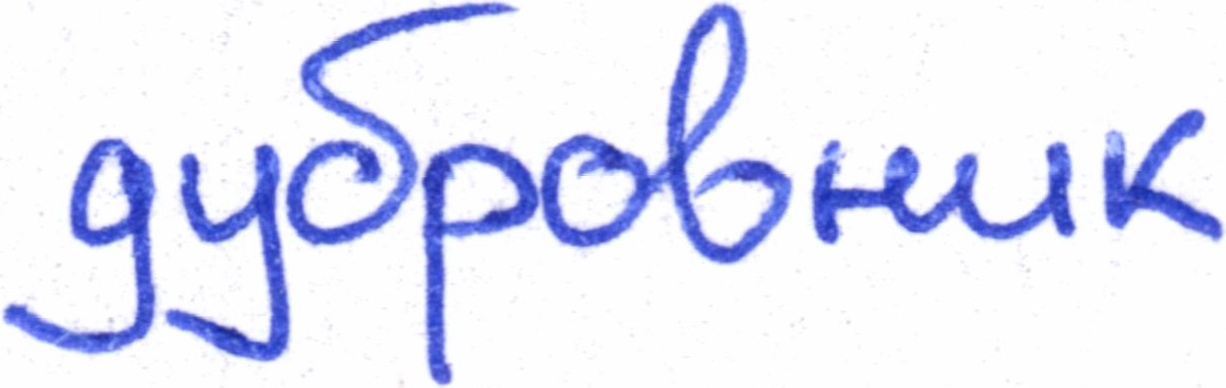дубровник
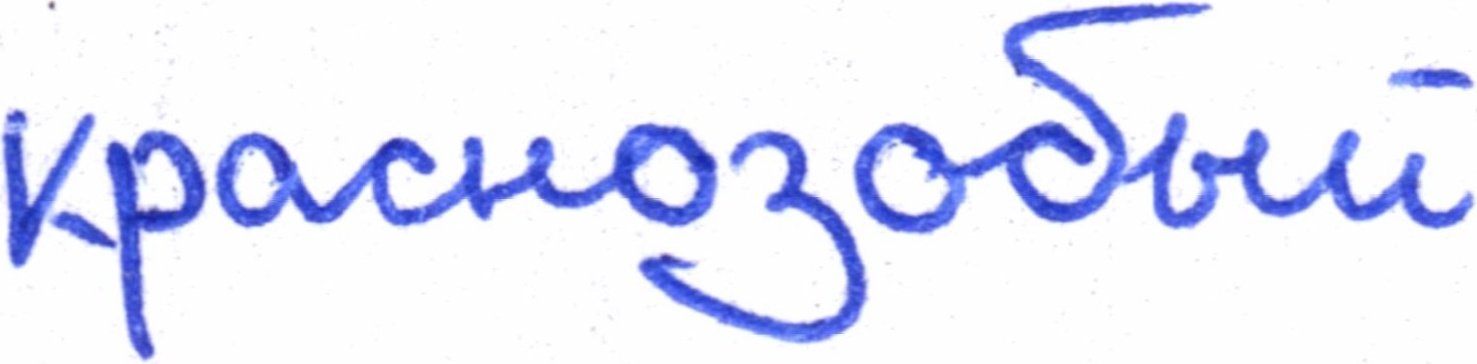краснозобый
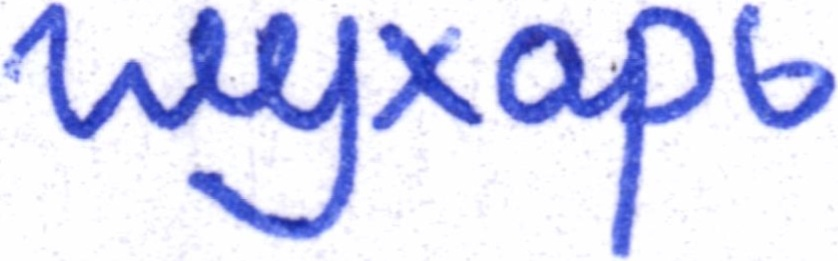глухарь
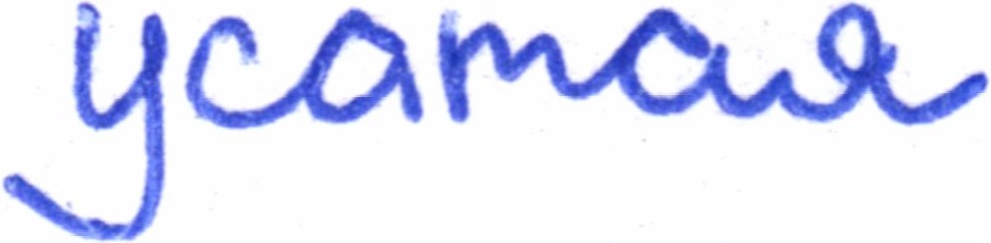усатая
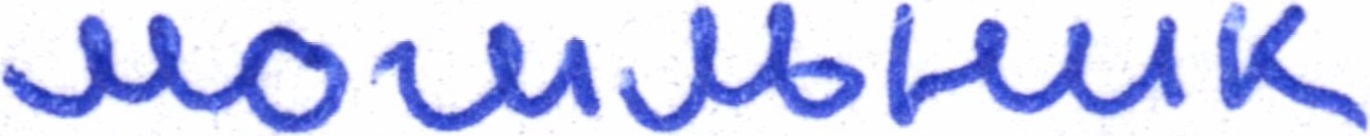могильник
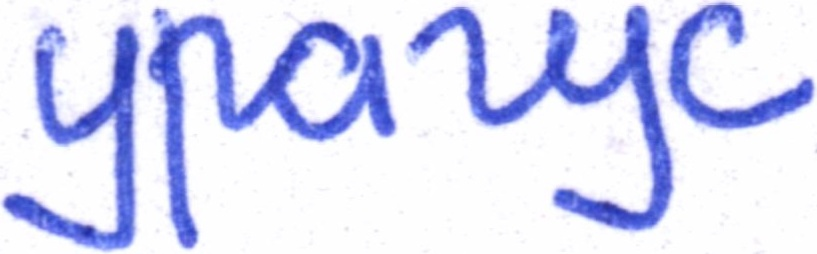урагус
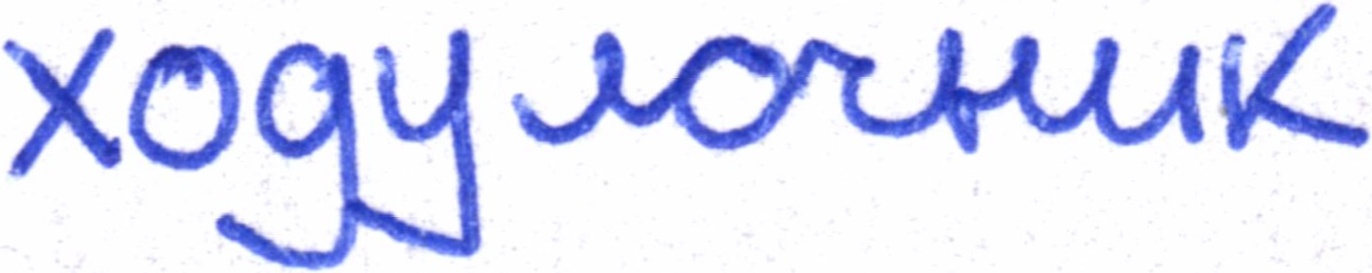ходулочник
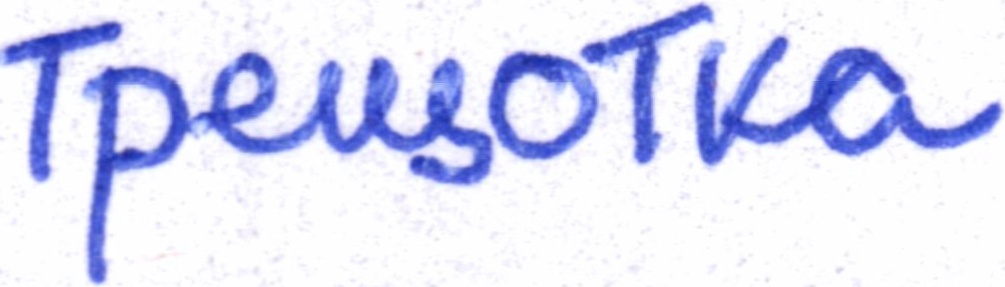трещотка
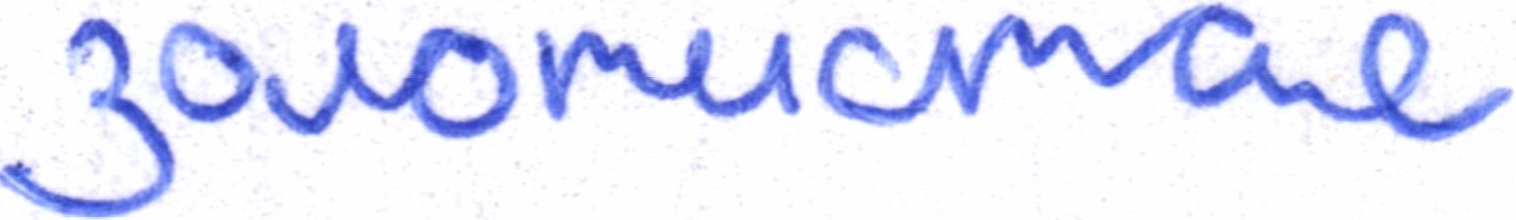золотистая
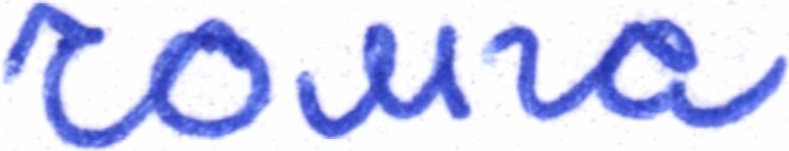чомга
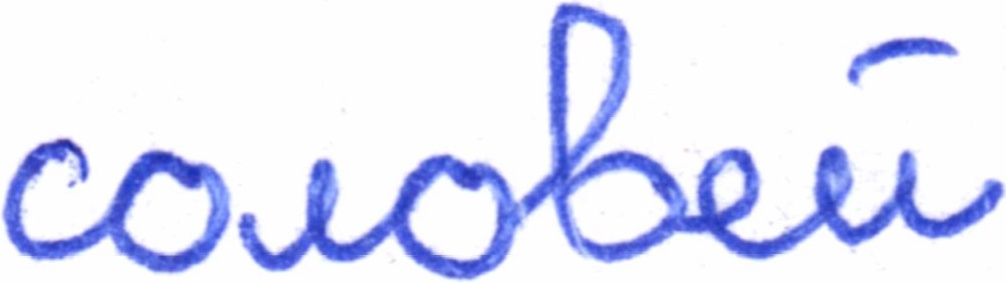соловей
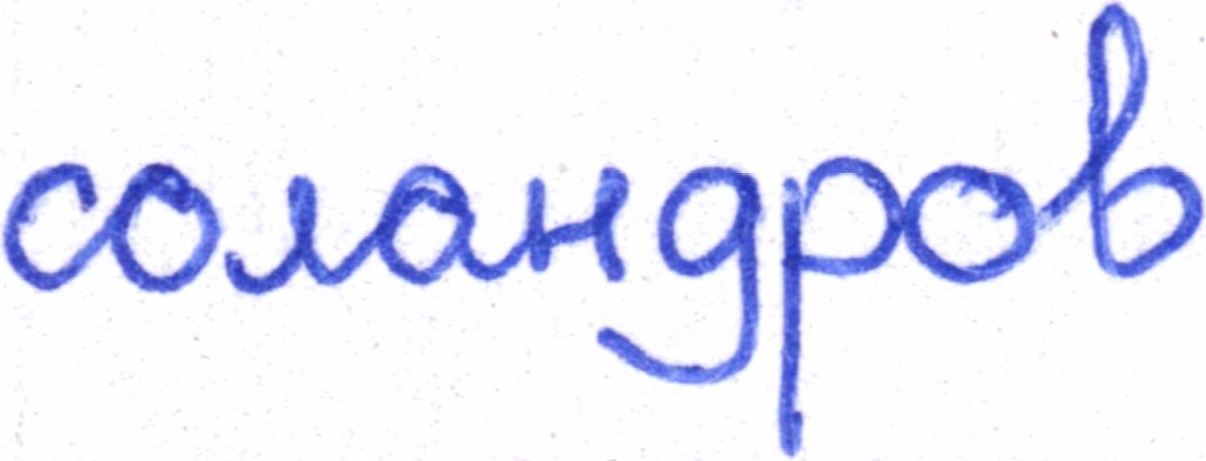соландров
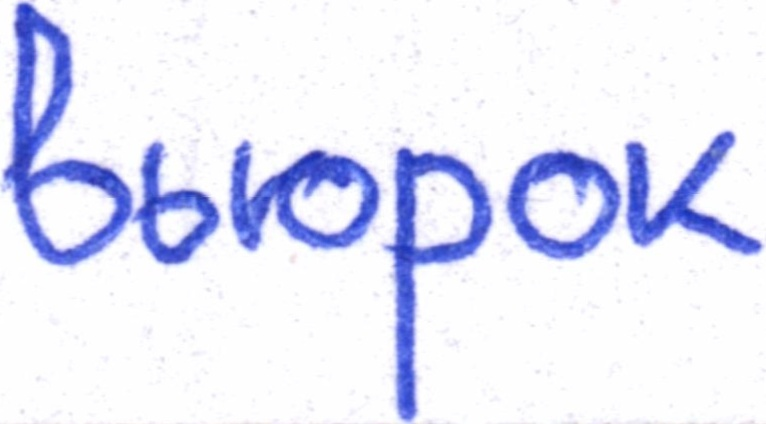вьюрок
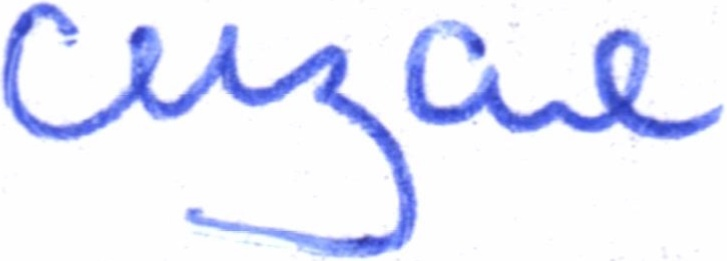сизая
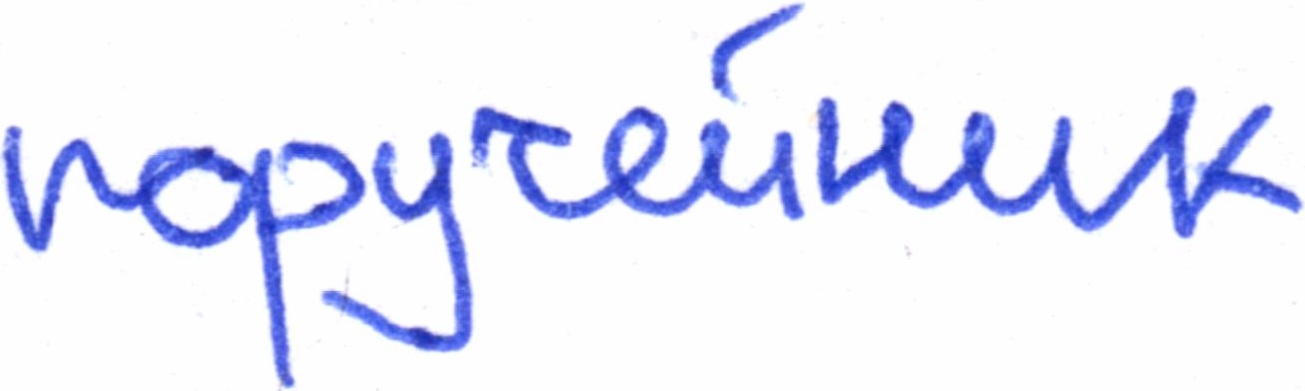поручейник
